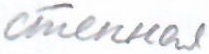степная
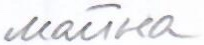майна
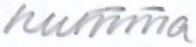питта
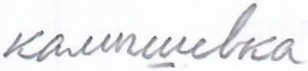камышевка
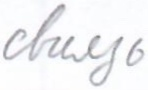свиязь
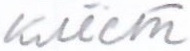клёст
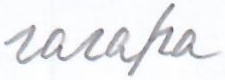гагара
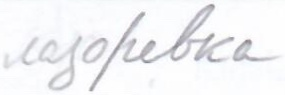лазоревка
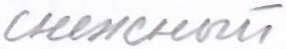снежный
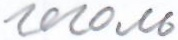гоголь
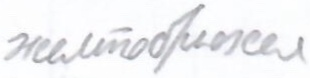желтобрюхая
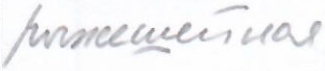рыжешейная
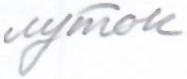луток
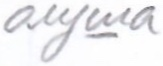олуша
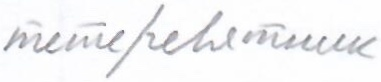тетеревятник
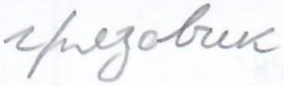грязовик
